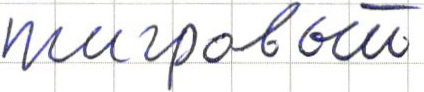тигровый
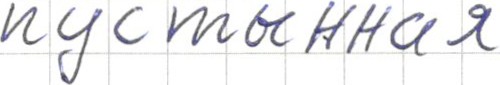пустынная
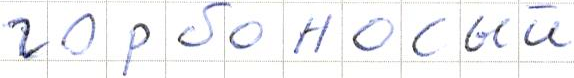горбоносый
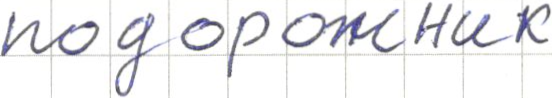подорожник
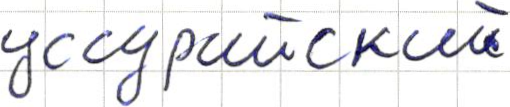уссурийский
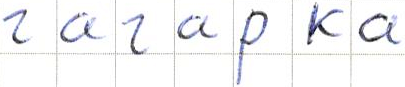гагарка
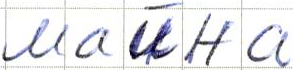майна
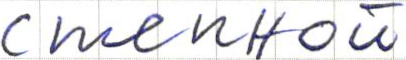степной
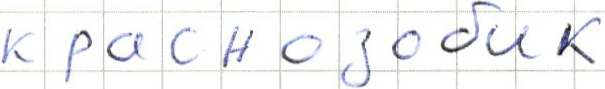краснозобик
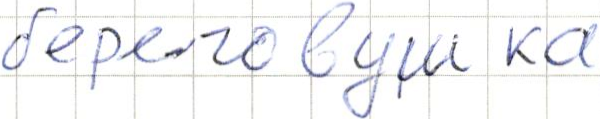береговушка
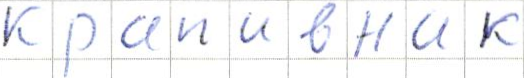крапивник
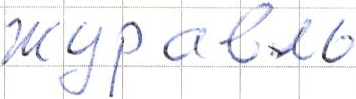журавль
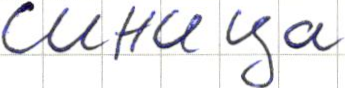синица
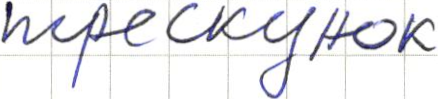трескунок
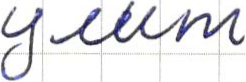улит
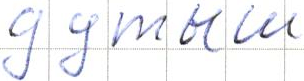дутыш
